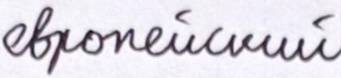европейский
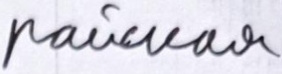райская
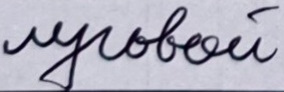луговой
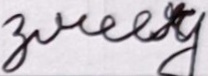змееяд
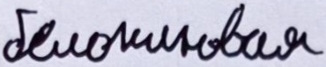белоклювая
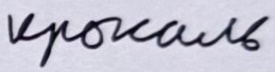крохаль
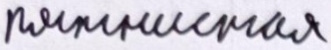пятнистая
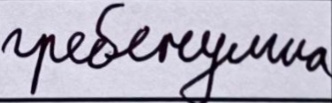гребенушка
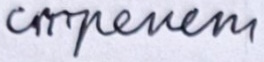стрепет
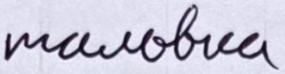таловка
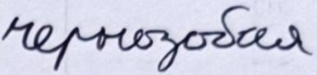чернозобая
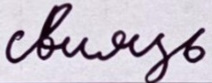свиязь
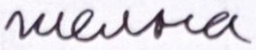желна
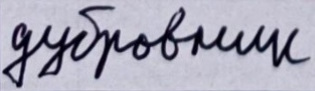дубровник
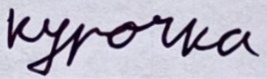курочка
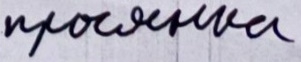просянка
